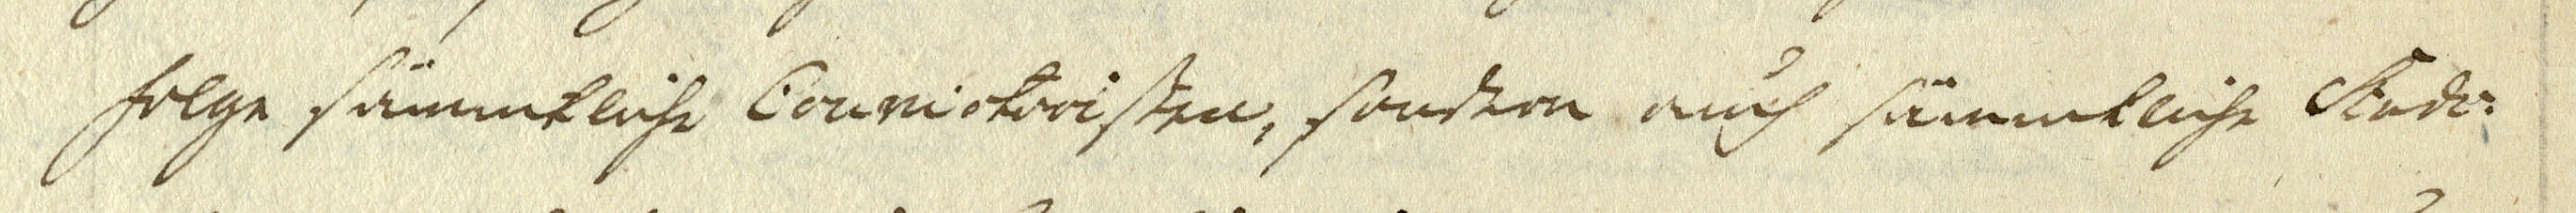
Folge sämmtliche Convictoristen, sondern auch sämmtliche Studi¬
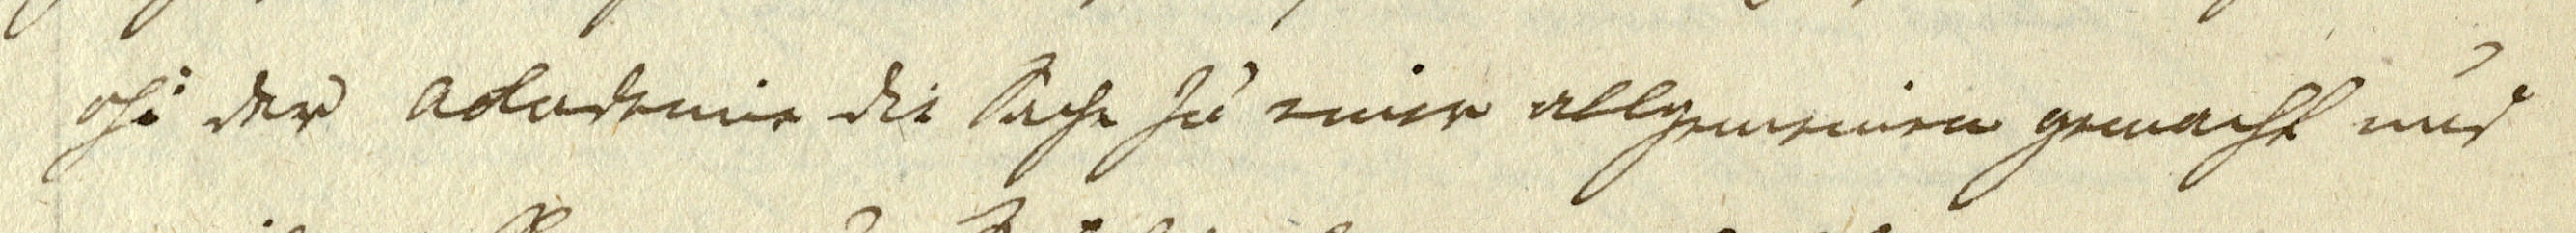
osi der Akademie die Sache zu einer allgemeinen gemacht und
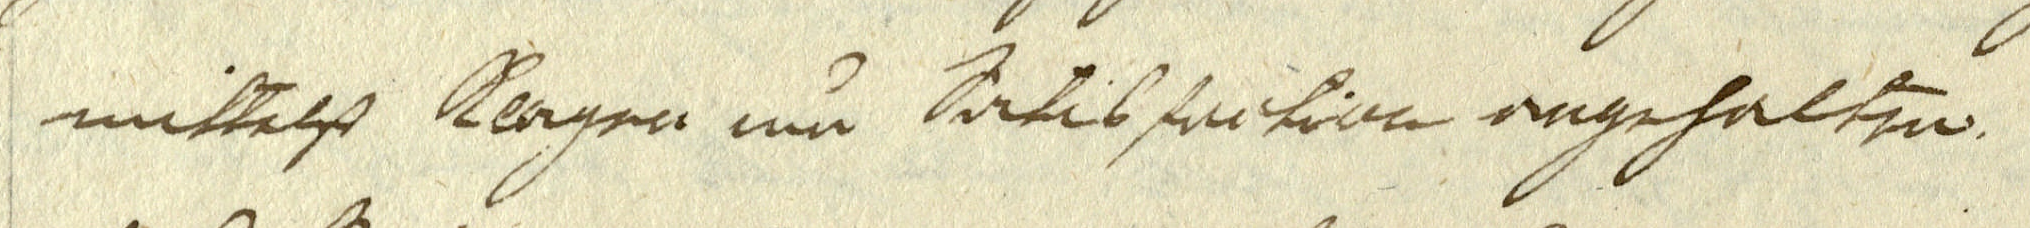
mittelst Klagen um Satisfaction angehalten.
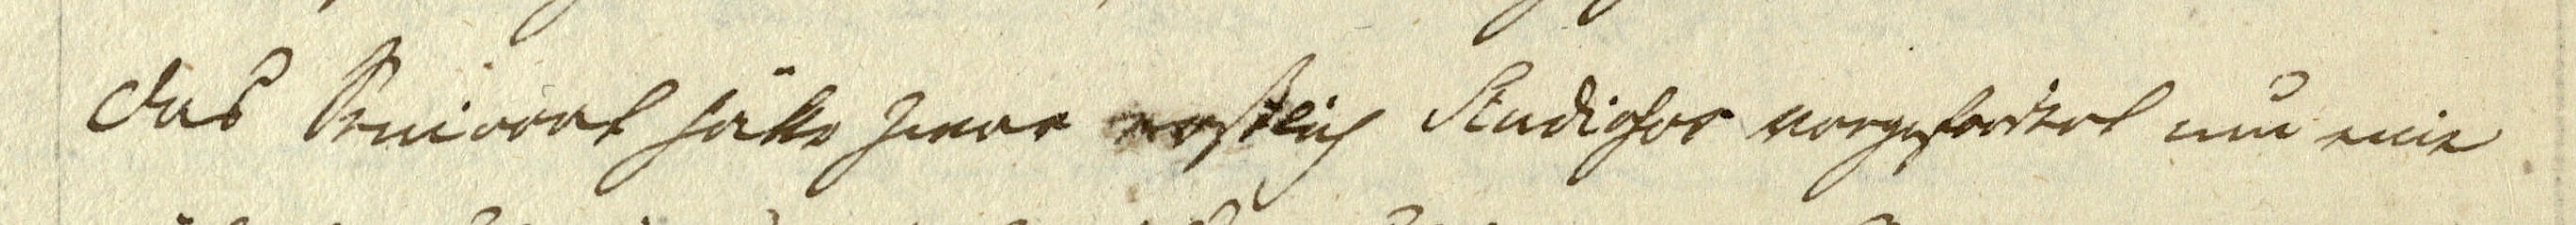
Das Seniorat hätte zwar erstlich Studios vorgefordert um eine
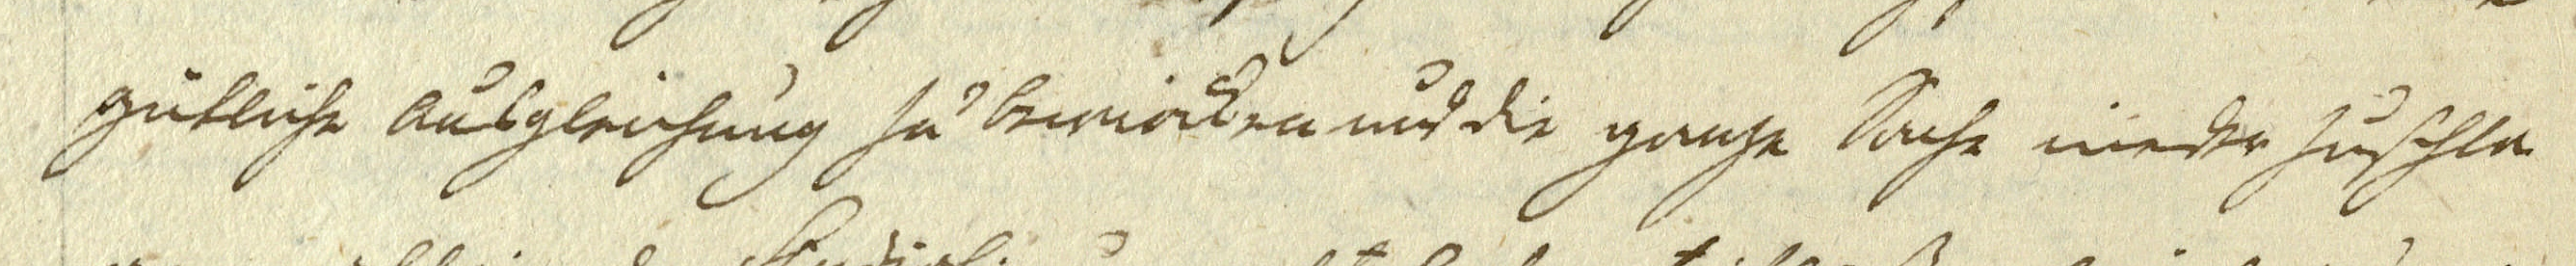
gütliche Ausgleichung zu bewircken und die ganze Sache nieder zuschla¬
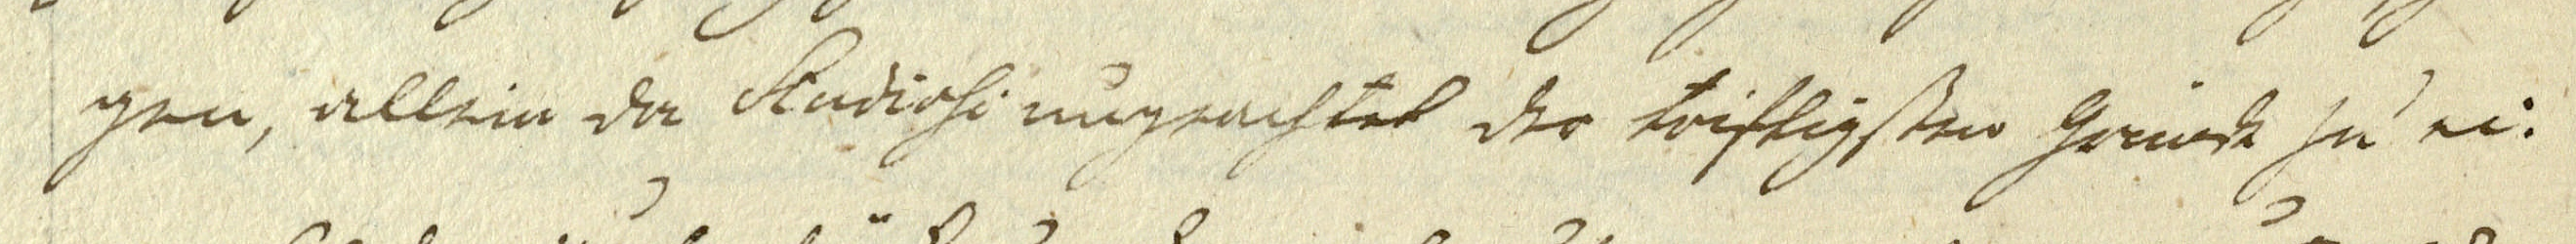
gen, allein da Studiosi ungeachtet der triftigsten Gründe zu ei¬
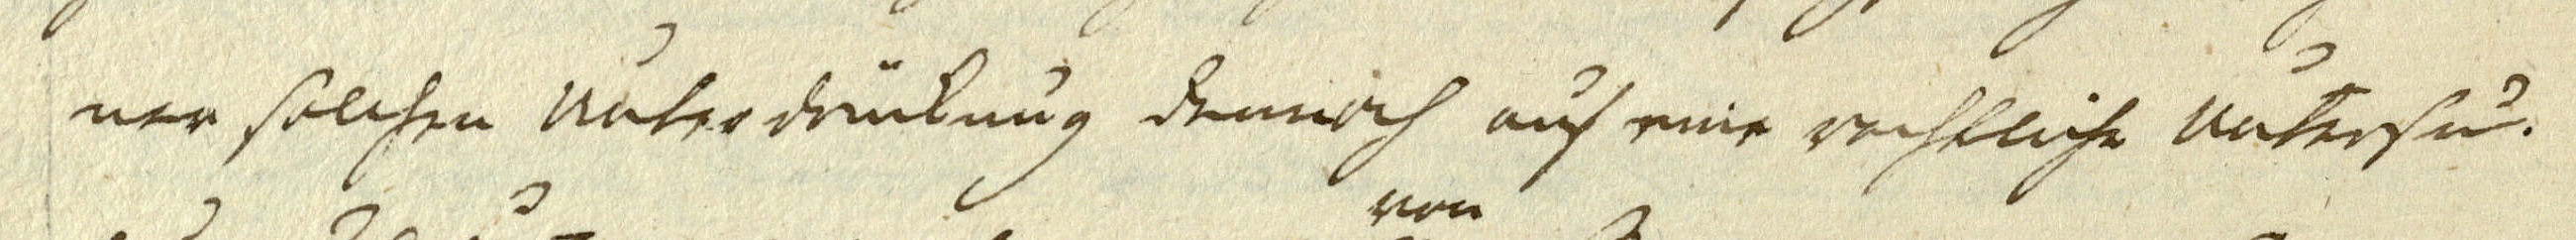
ner solchen Unterdrückung dennoch auf eine rechtliche Untersu¬
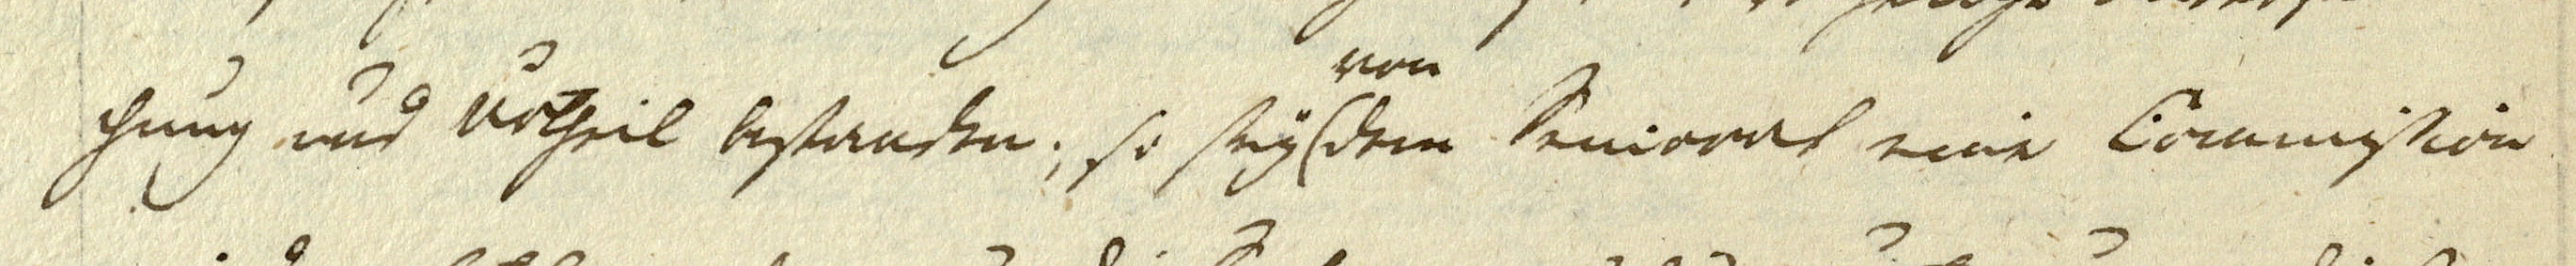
chung und Urtheil bestanden; so seÿ von dem Seniorat eine Commission
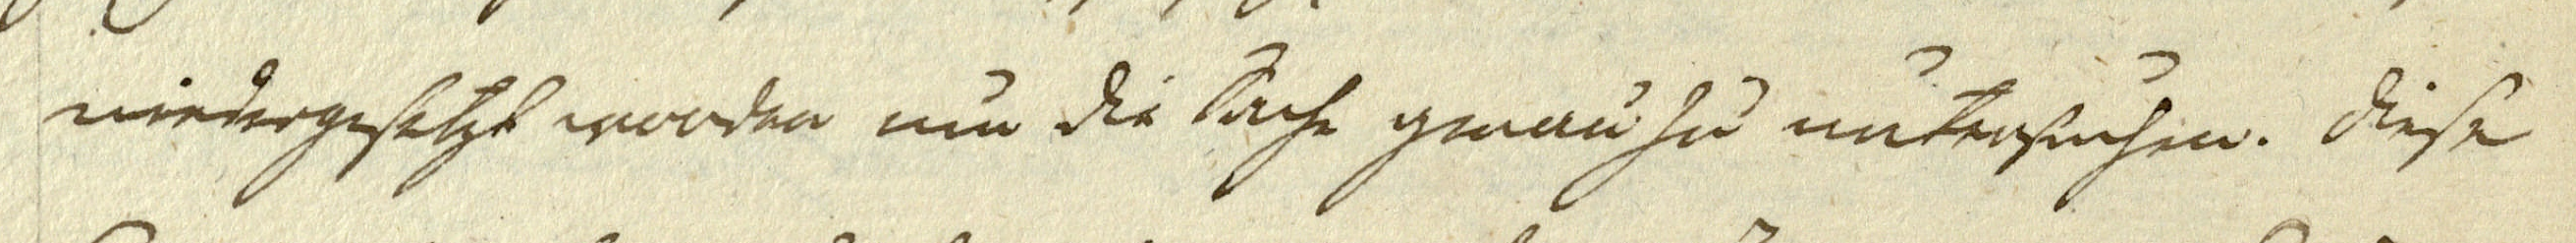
niedergesetzt worden, um die Sache genau zu untersuchen. Diese
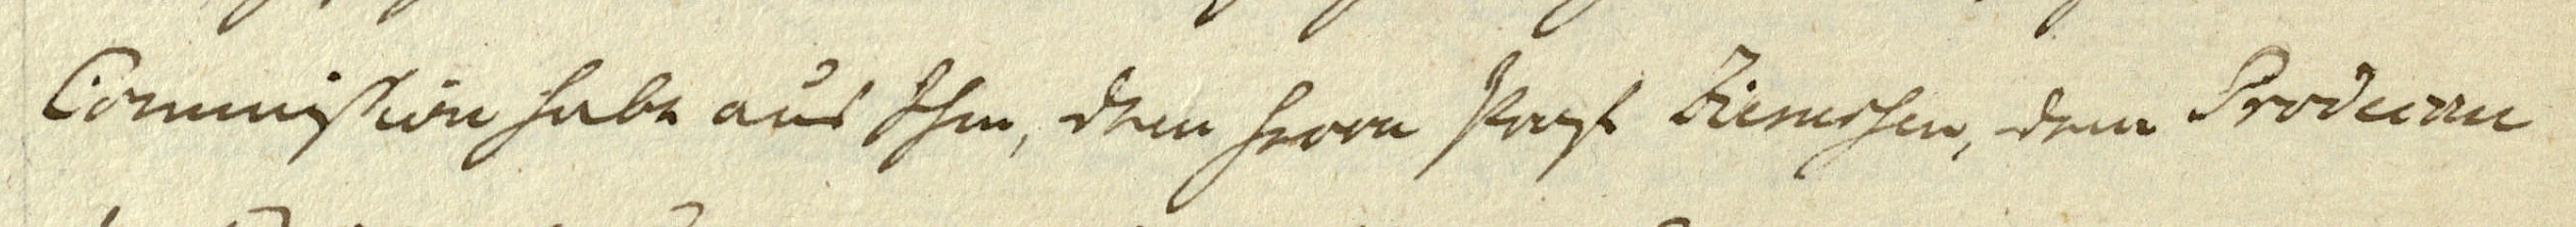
Commission habe aus Ihm, dem Herrn Prof. Ziemssen, dem Prodecan
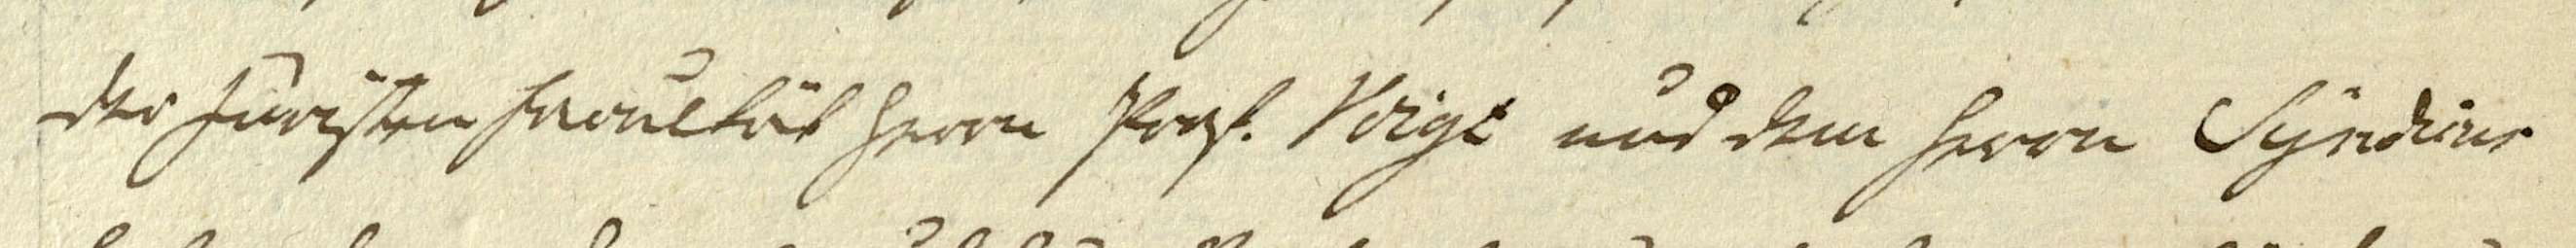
der Juristen Facultät Herrn Prof. Voigt und dem Herrn Sÿndicus
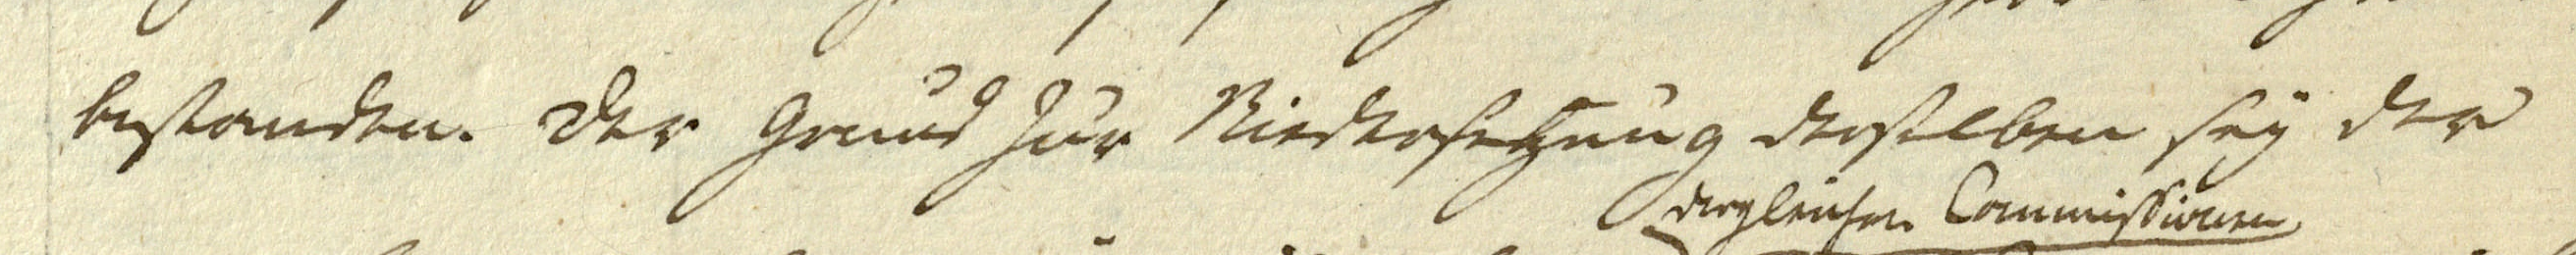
bestanden. Der Grund zur Niedersetzung derselben seÿ der
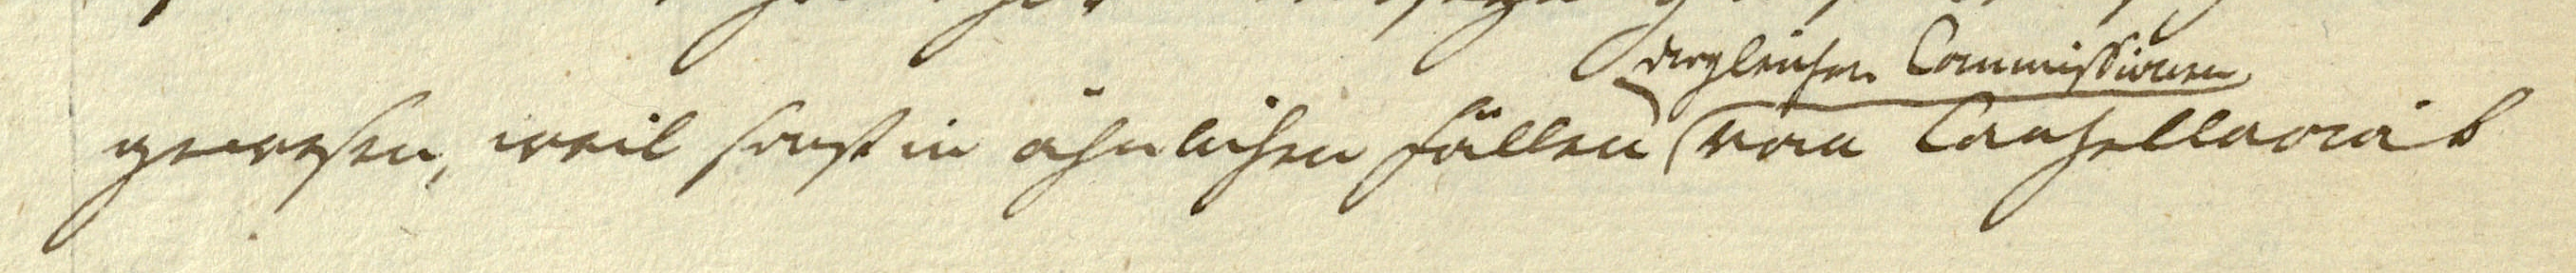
gewesen, weil sonst in ähnlichen Fällen dergleichen Commissionen vom Canzellariat
